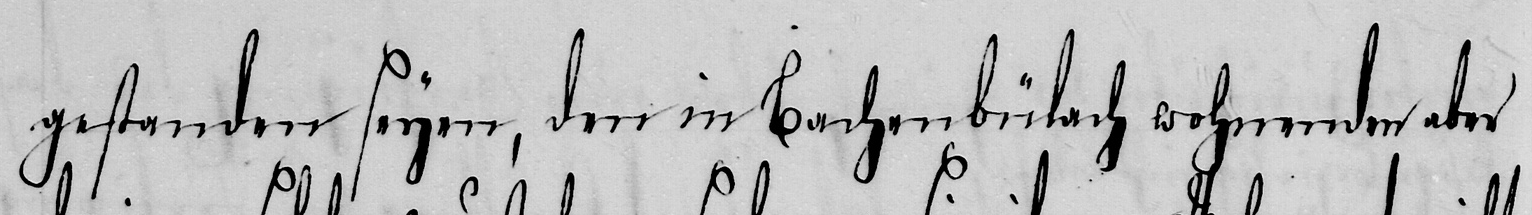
gestanden seyen, den in Bachenbülach wohnenden aber
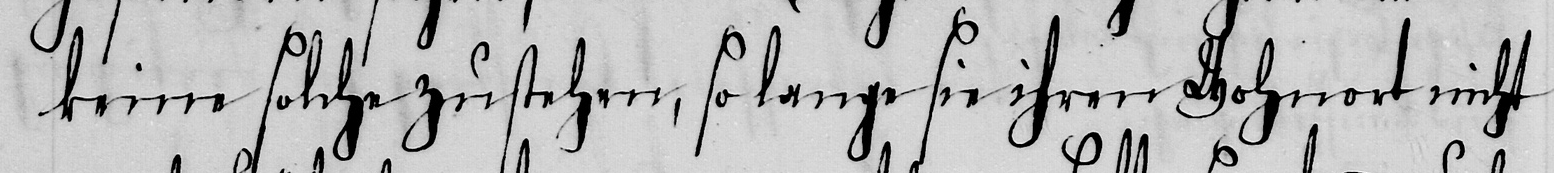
keine solche zustehen, so lange sie ihren Wohnort nicht
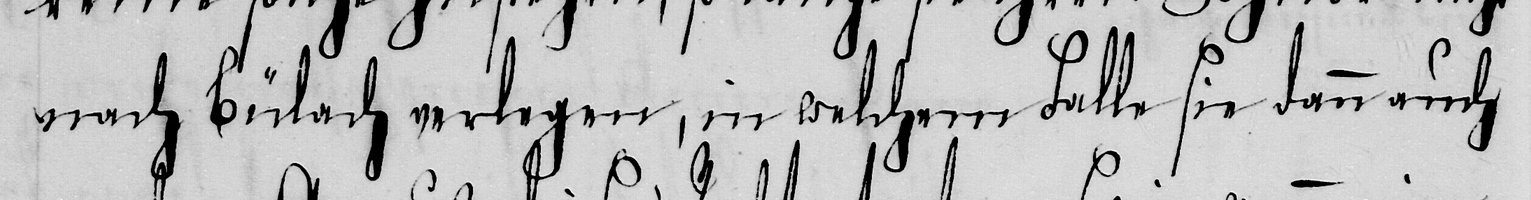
nach Bülach verlegen, in welchem Falle sie dann auch
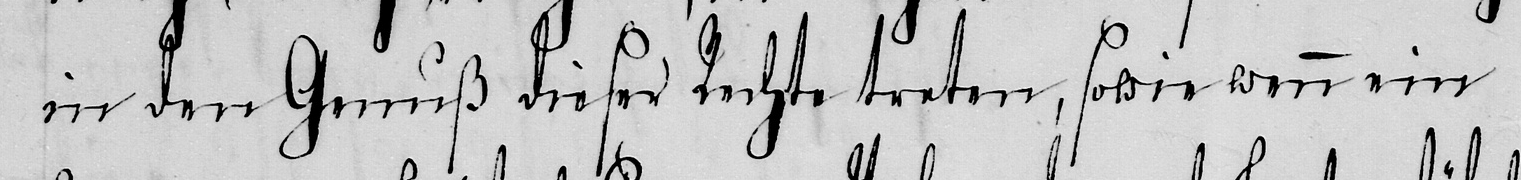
in den Genuß dieser Rechte treten, sowie wenn ein
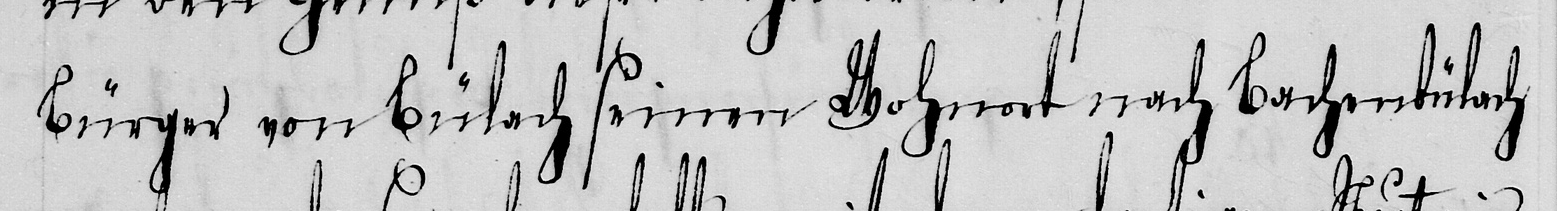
Bürger von Bülach seinen Wohnort nach Bachenbülach
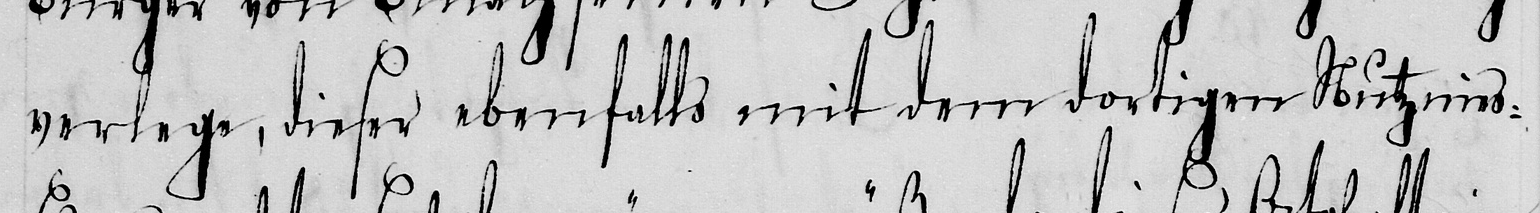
verlege, dieser ebenfalls mit dem dortigen Nutznieß¬
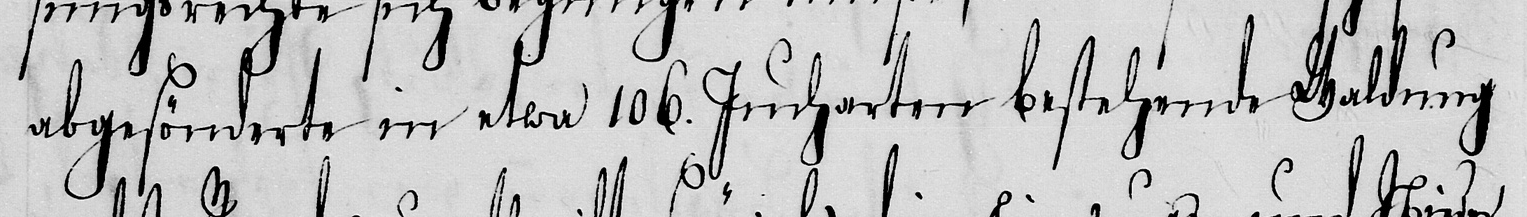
abgesönderte in etwa 106. Jucharten bestehende Waldung
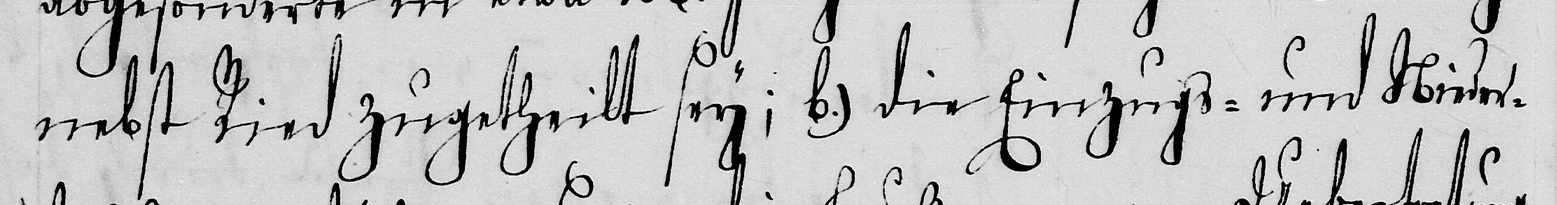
nebst Ried zugetheilt sey; b.) die Einzugs- und Nieder¬
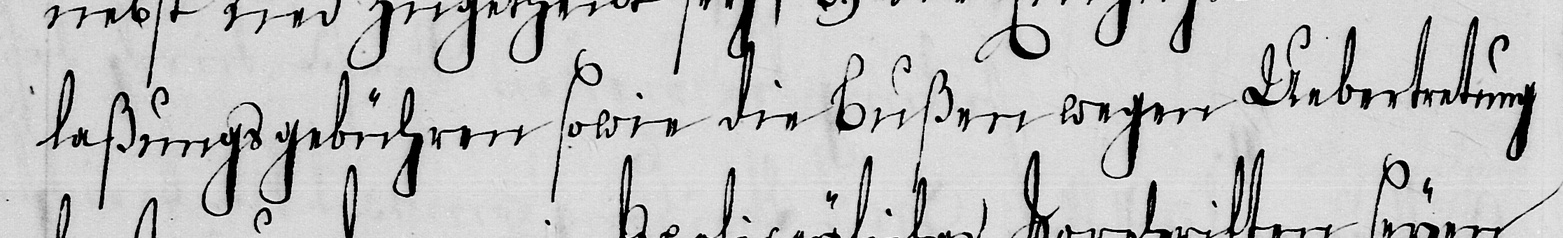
laßungsgebühren sowie die Bußen wegen Uebertretung
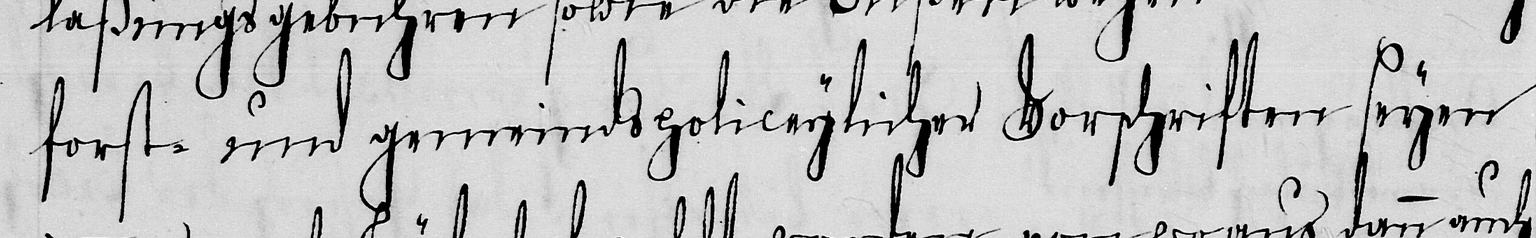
forst- und gemeindspoliceylicher Vorschriften seyen
